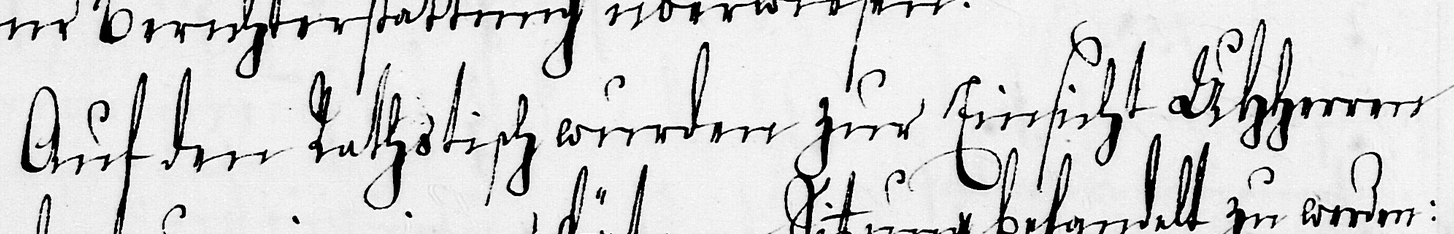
Auf den Rathstisch wurden zur Einsicht UHHerren
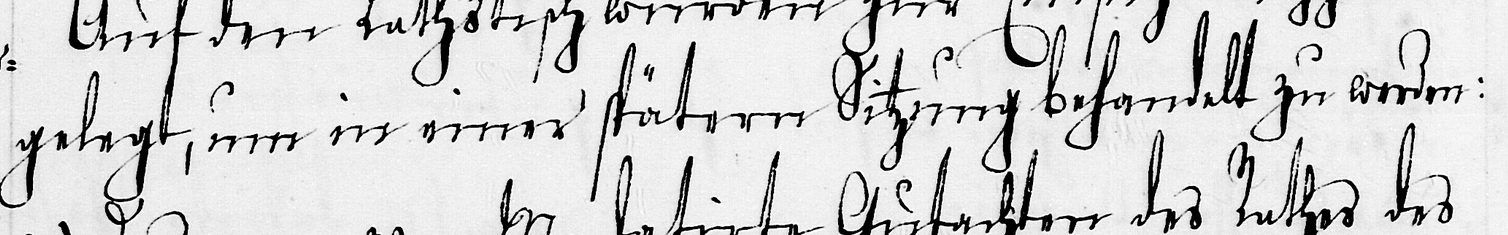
gelegt, um in einer spätern Sitzung behandelt zu werden:
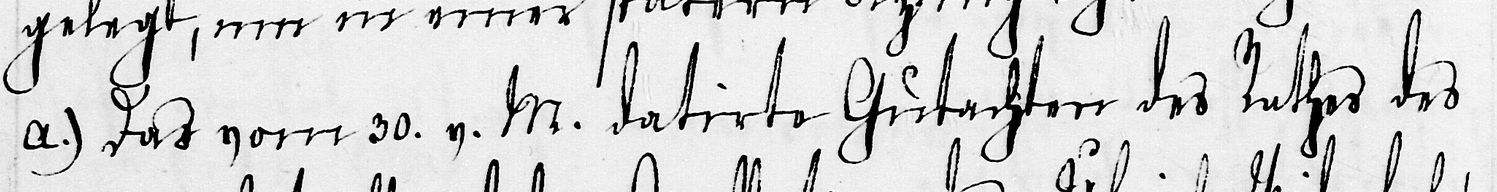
a.) Das vom 30. v. M. datirte Gutachten des Rathes des
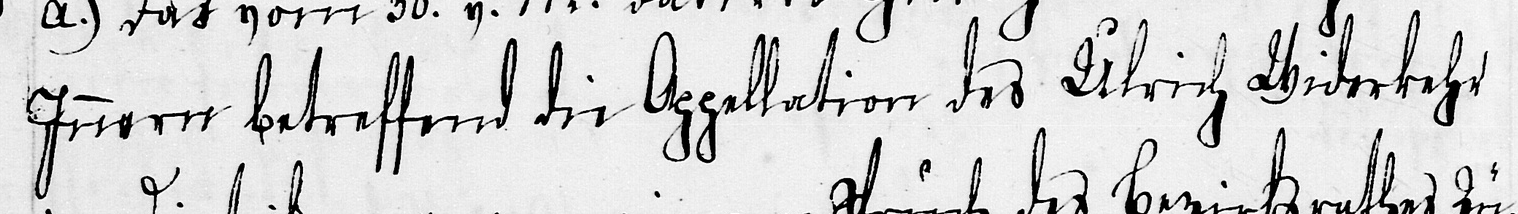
Innern betreffend die Appellation des Ulrich Widerkehr
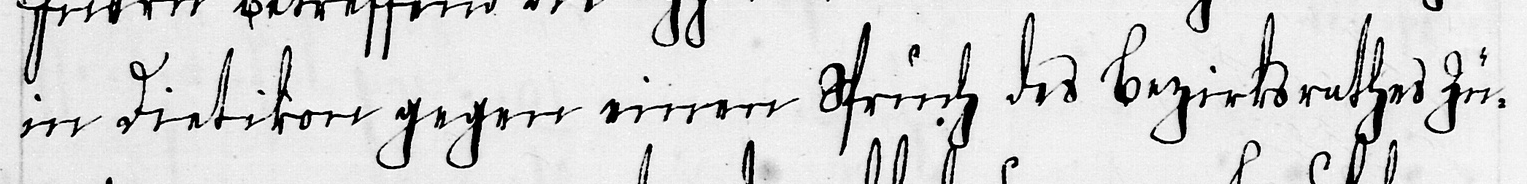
in Dietikon gegen einen Spruch des Bezirksrathes Zü¬
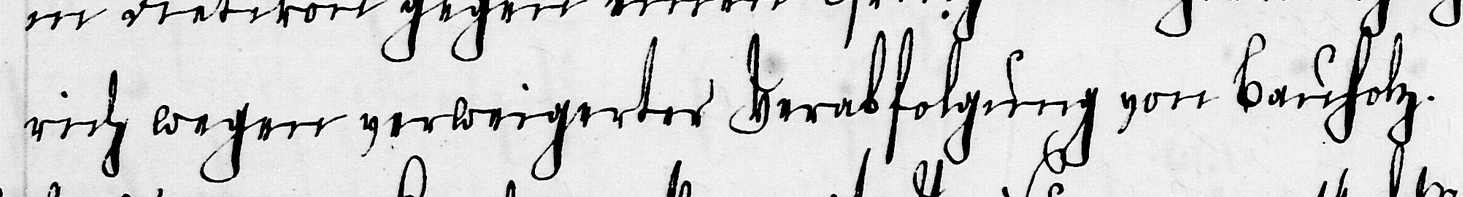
rich wegen verweigerter Verabfolgung von Bauholz.
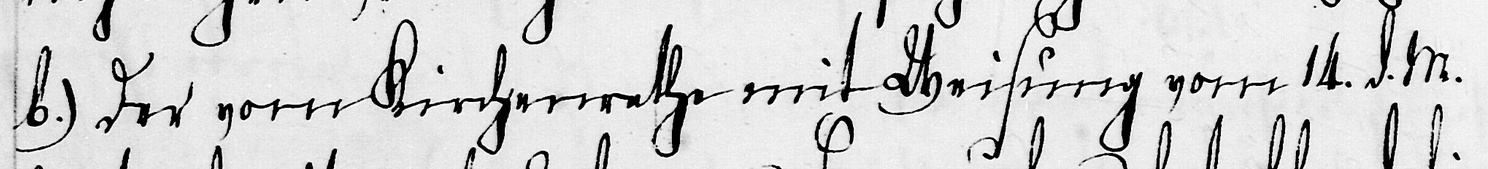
b.) Der vom Kirchenrathe mit Weisung vom 14. d. M.
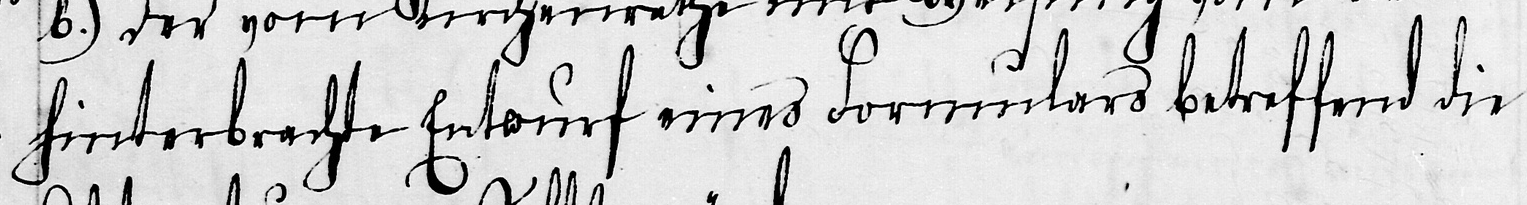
hinterbrachte Entwurf eines Formulars betreffend die
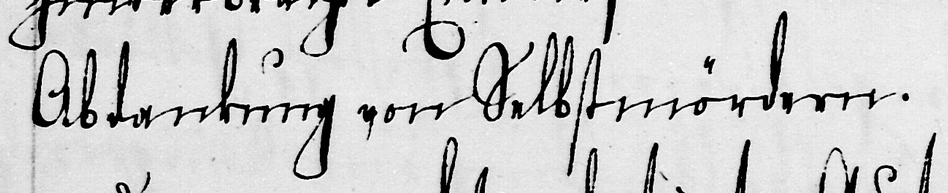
Abdankung von Selbstmördern.
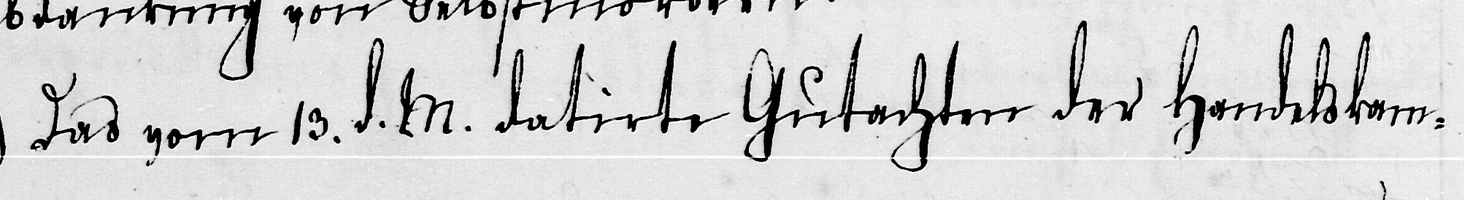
Das vom 13. d. M. datirte Gutachten der Handelskam-
